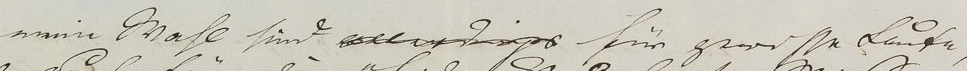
meine Wahl sind allerdings für gewisse Leute,
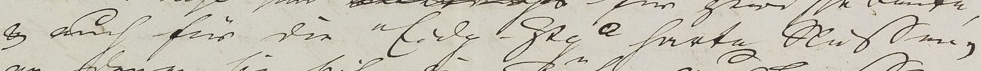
& auch für die «Eidg-Ztg» harte Nussen,
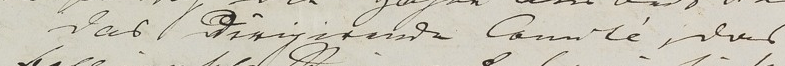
Das dirigirende Comité, das
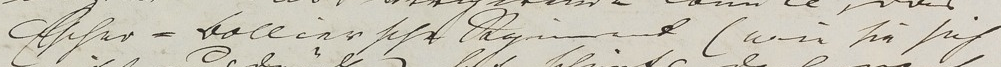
Escher-Bolliersche Regiment (wie sie sich
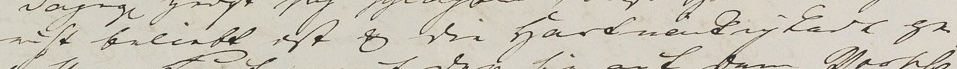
nicht beliebt ist & die Hartnäckigkeit ge-
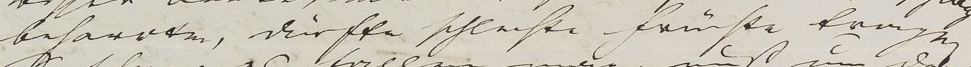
beharrten, dürfte schlechte Früchte tragen.
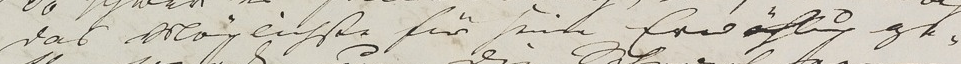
das Möglichste für seine Erwählung ge-
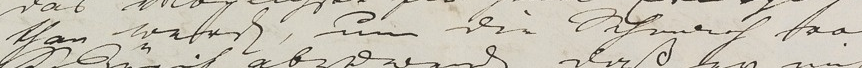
than werden, um die Schmach vom
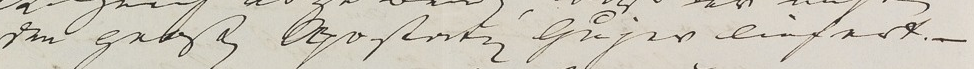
den großen Apostaten Gujer liefert. –
